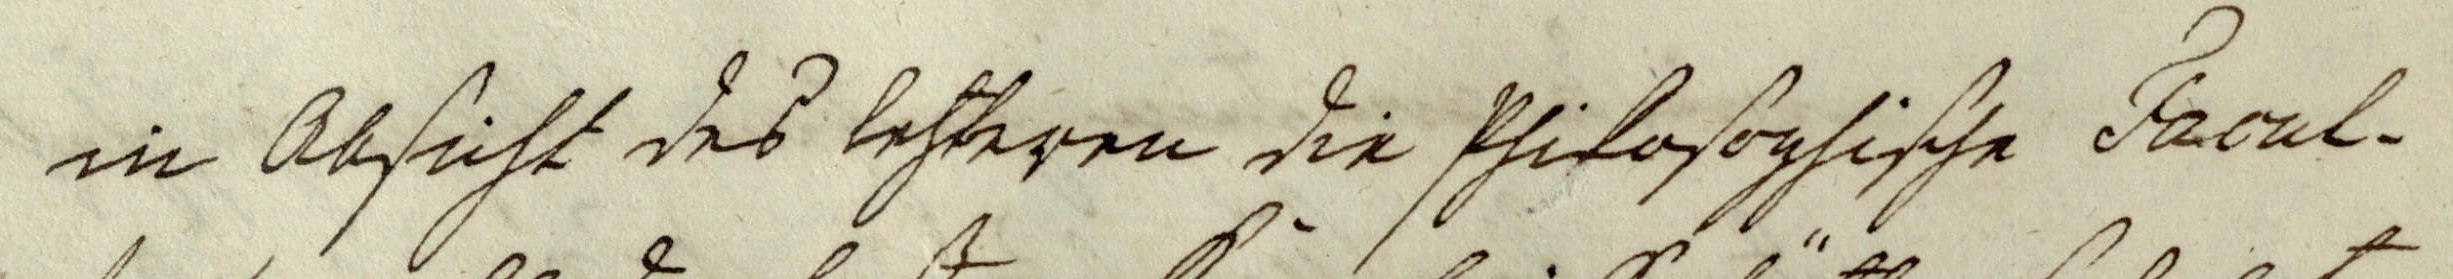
in Absicht des letzteren die Philosophische Facul¬
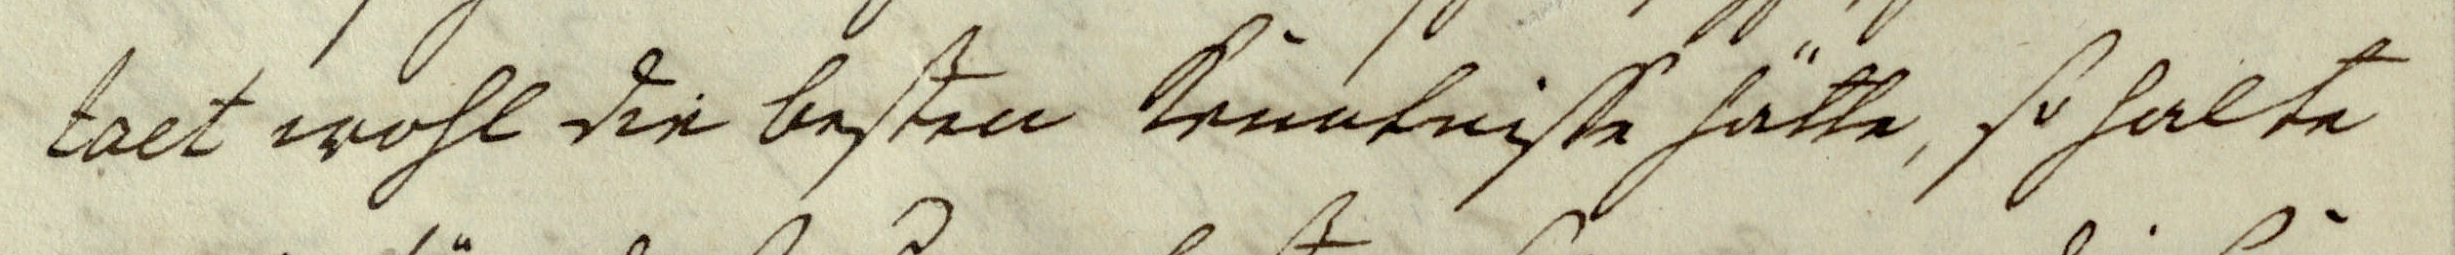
taet wohl die besten Kenntnisse hätte, so halte
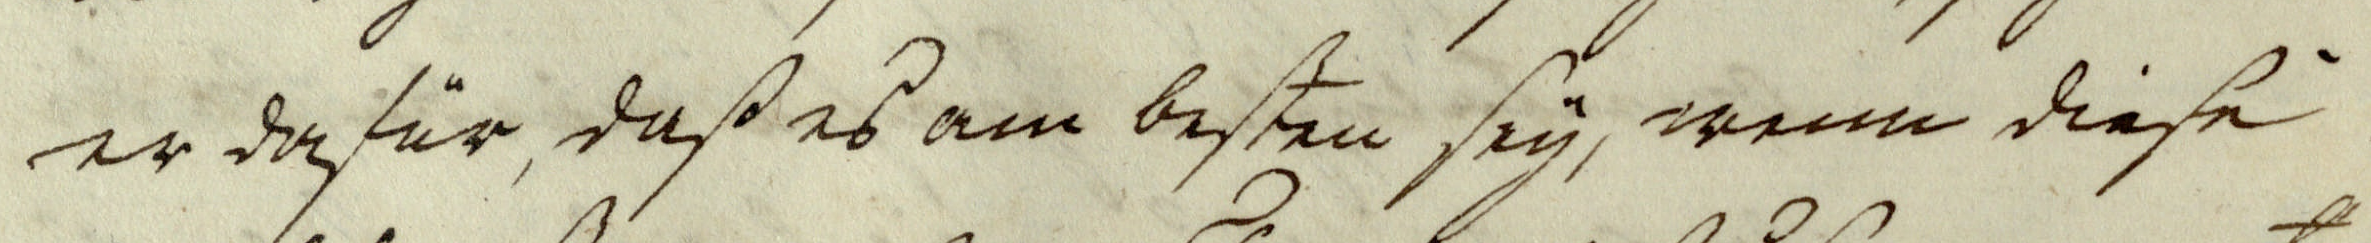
er dafür, daß es am besten seÿ, wenn diese
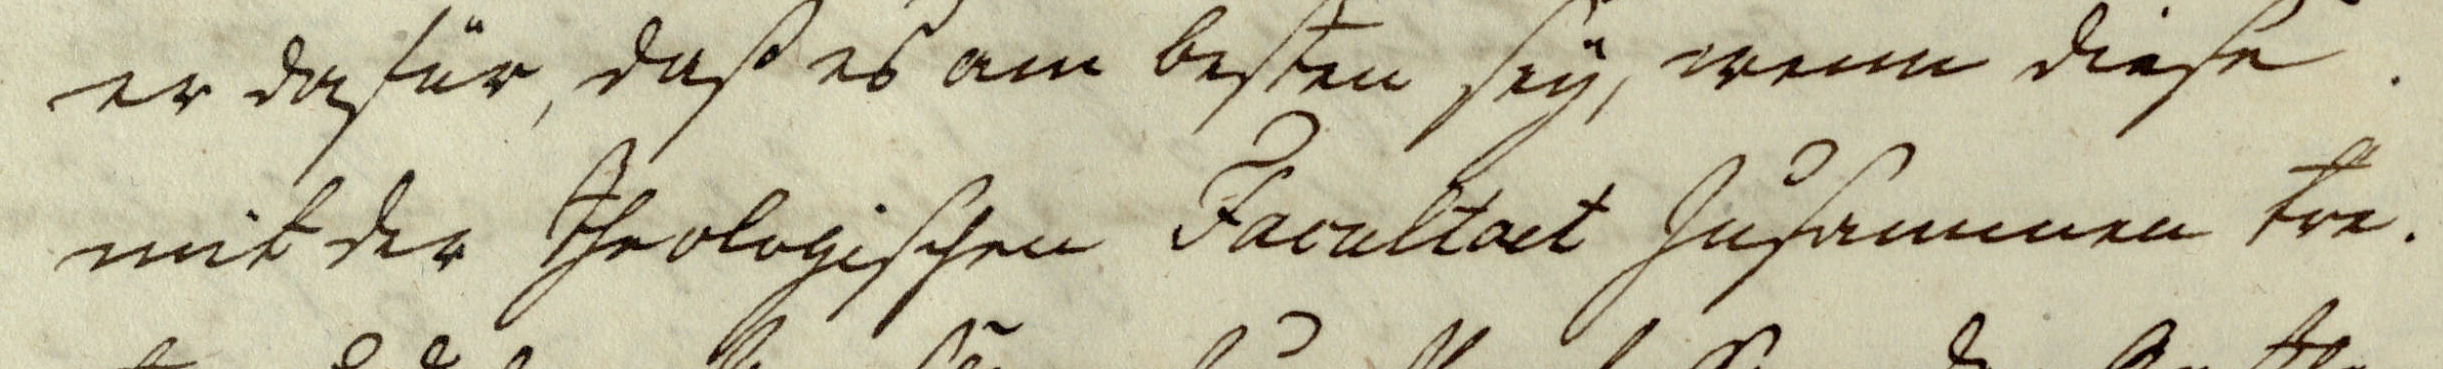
mit der Theologischen Facultaet zusammen tre¬
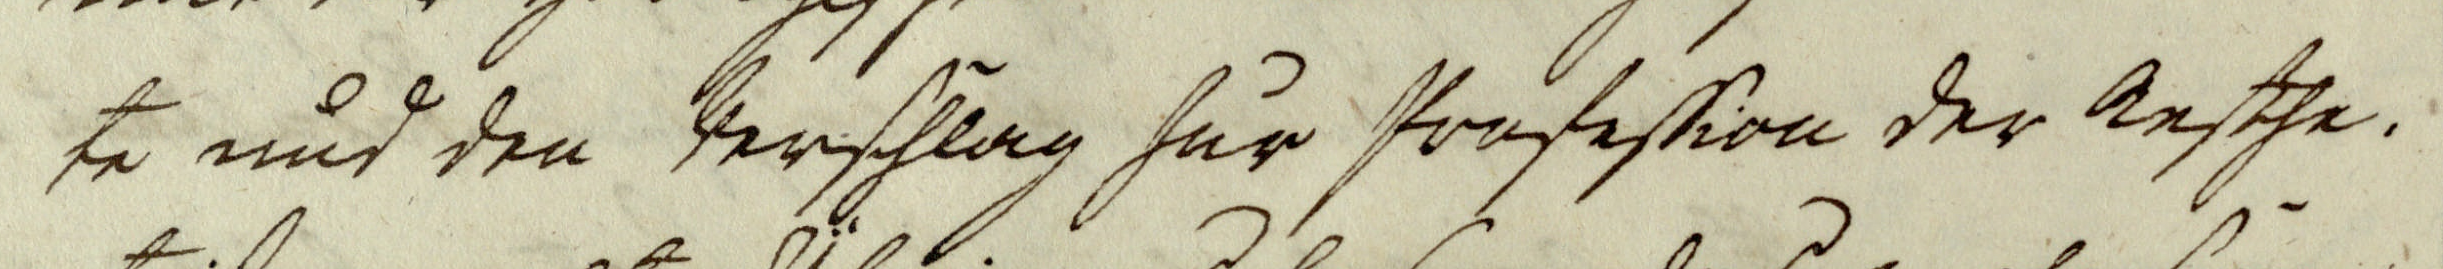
te und den Vorschlag zur Profession der Aesthe¬
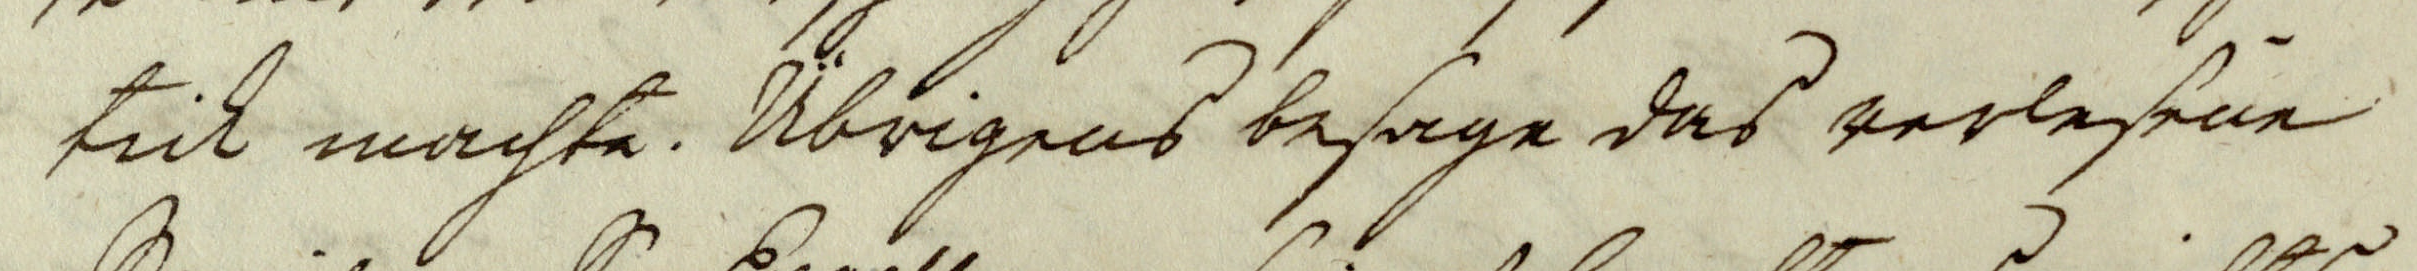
tik machte. Übrigens besage das verlesene
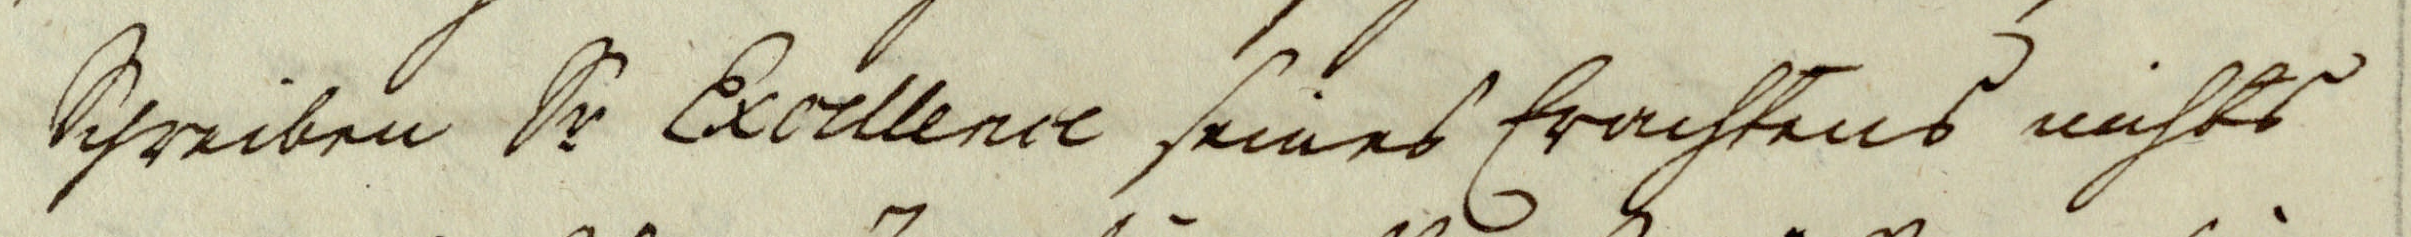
Schreiben Sr. Excellence seines Erachtens nichts
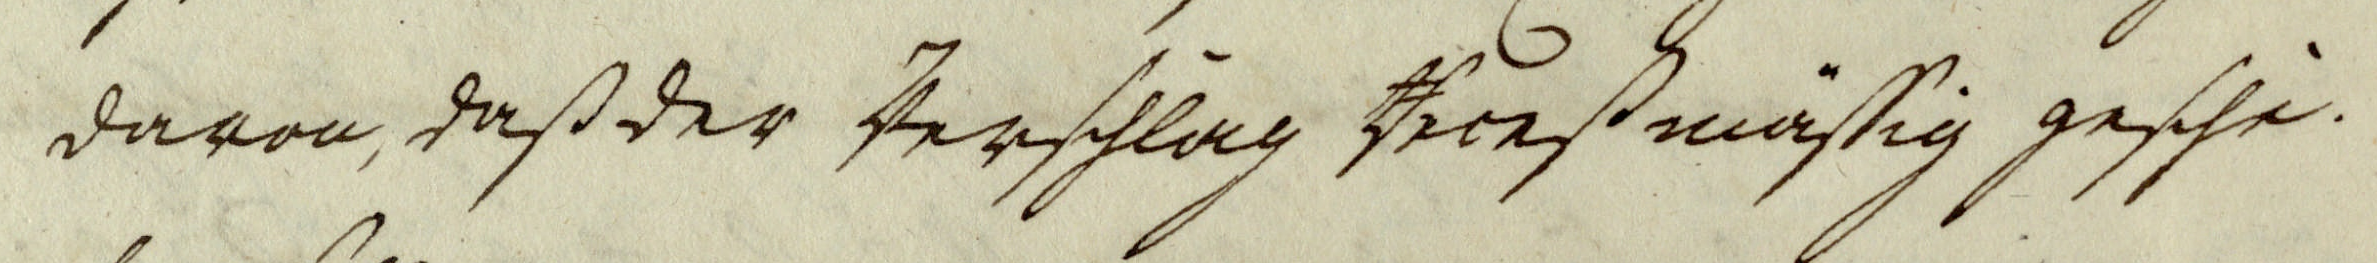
davon, daß der Vorschlag Receß mässig gesche¬
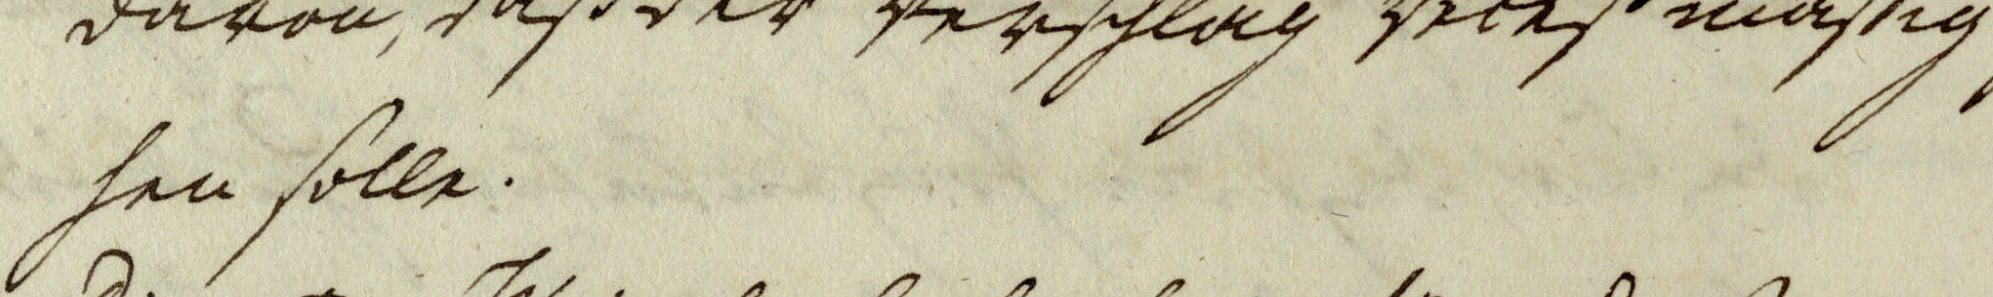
hen solle.
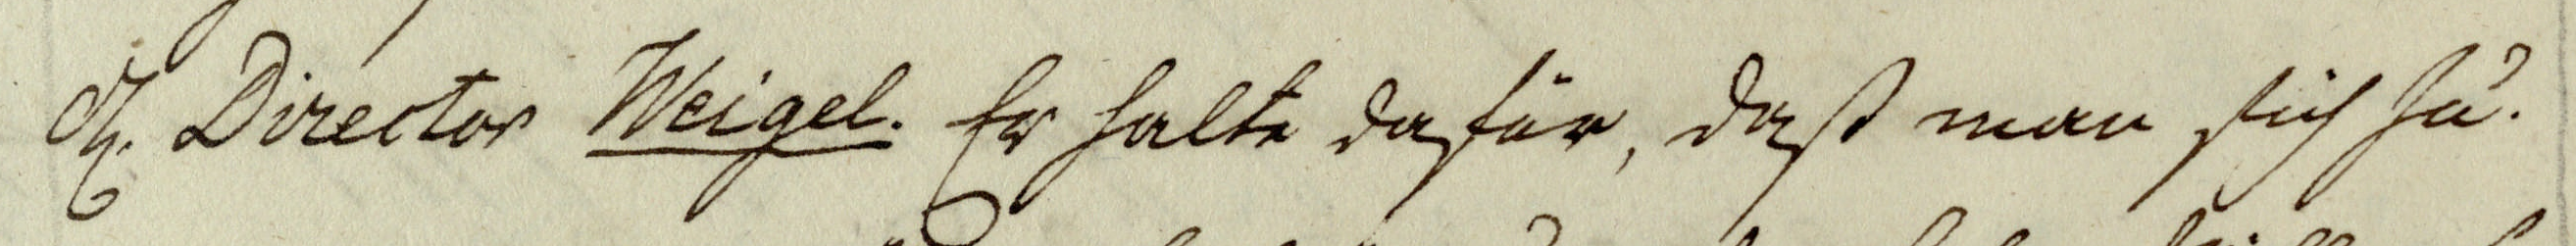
dh. Director Weigel. Er halte dafür, daß man sich zu¬
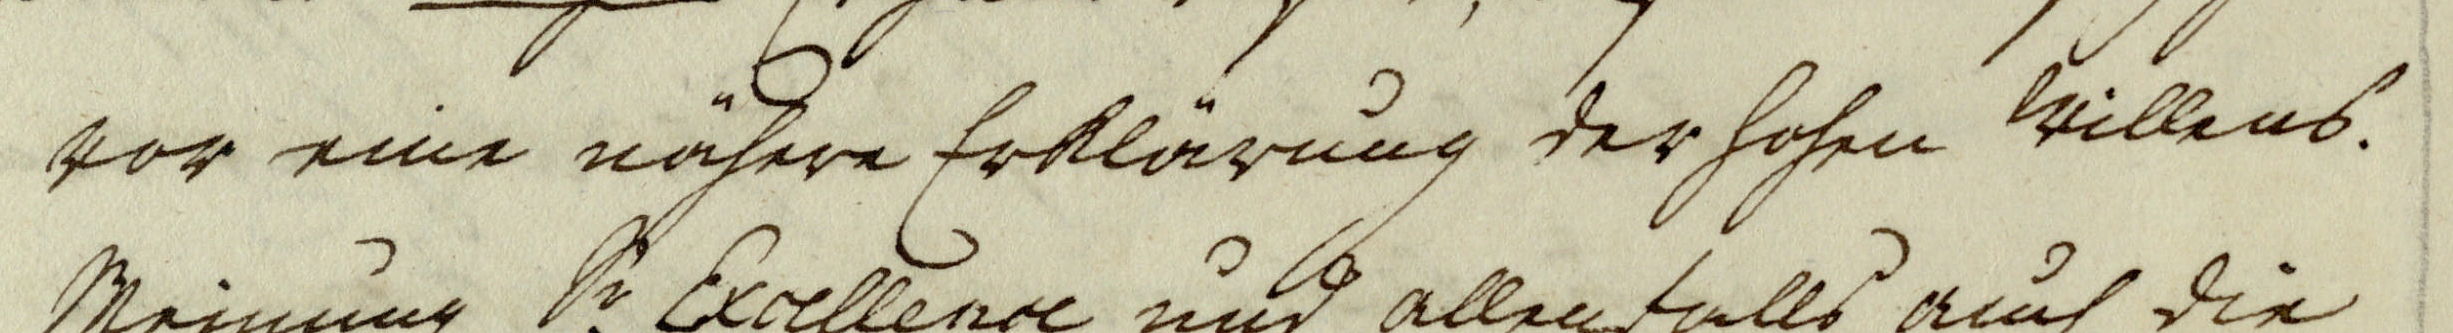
vor eine nähere Erklärung der hohen Willens¬
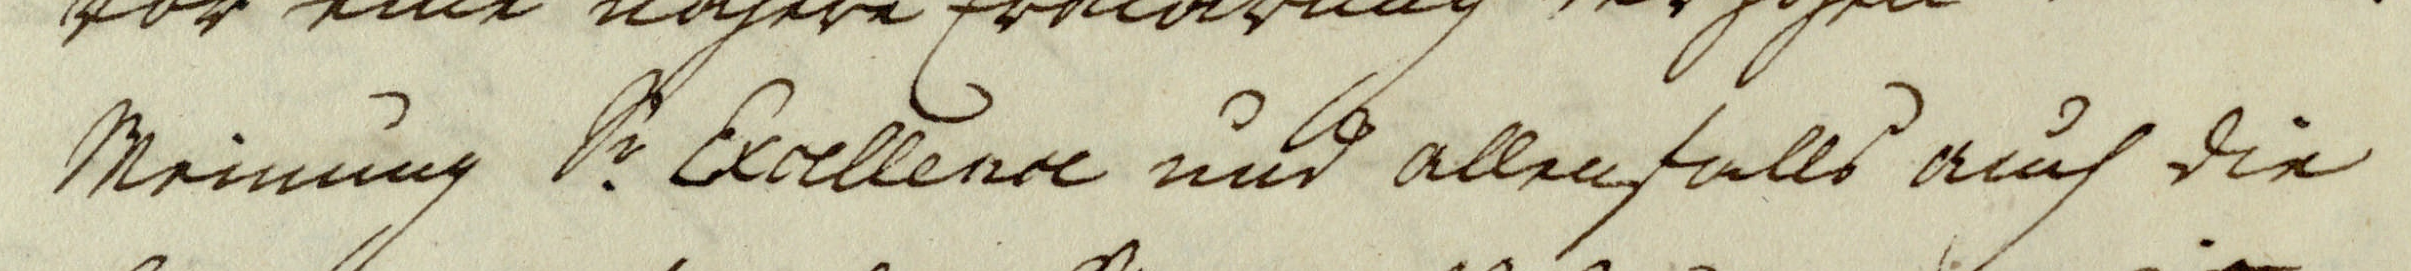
Meinung Sr. Excellence und allenfalls auch die
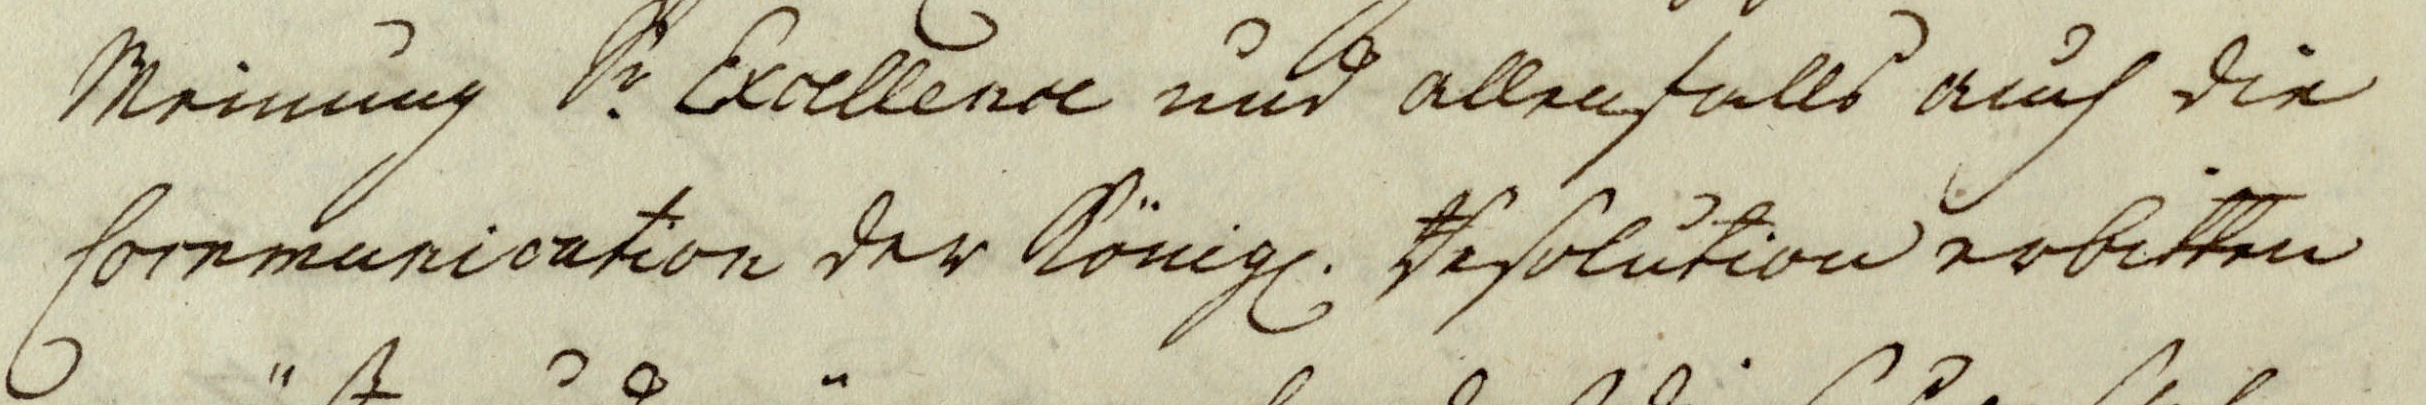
Communication der Königl. Resolution erbitten
